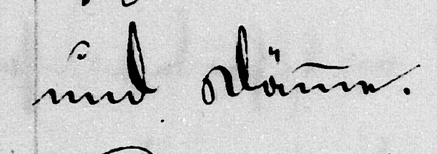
und Dämme.
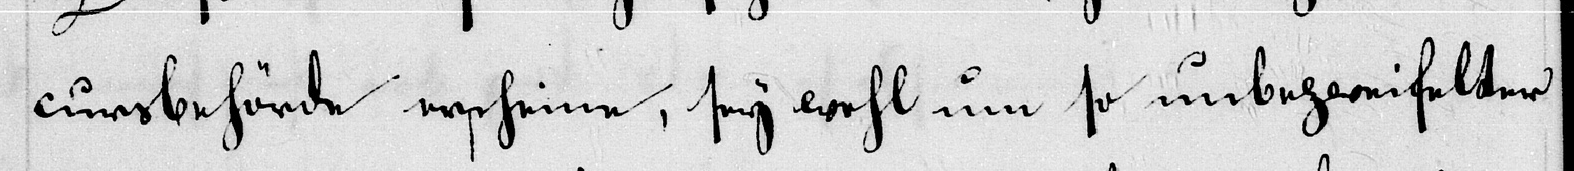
cursbehörde erscheine, sey wohl um so unbezweifelter
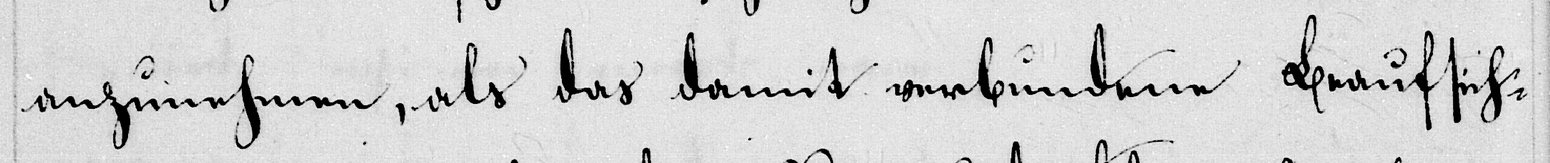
anzunehmen, als das damit verbundene Beaufsich¬
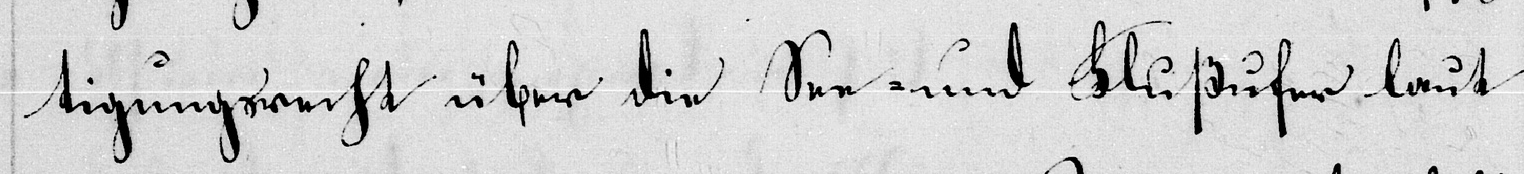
tigungsrecht über die See- und Flußufer laut
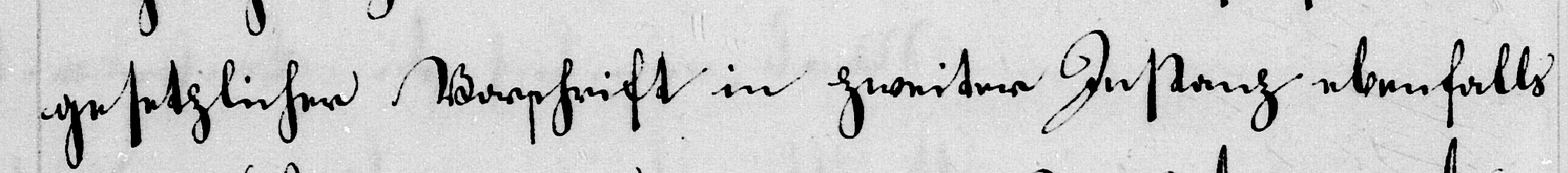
gesetzlicher Vorschrift in zweiter Instanz ebenfalls
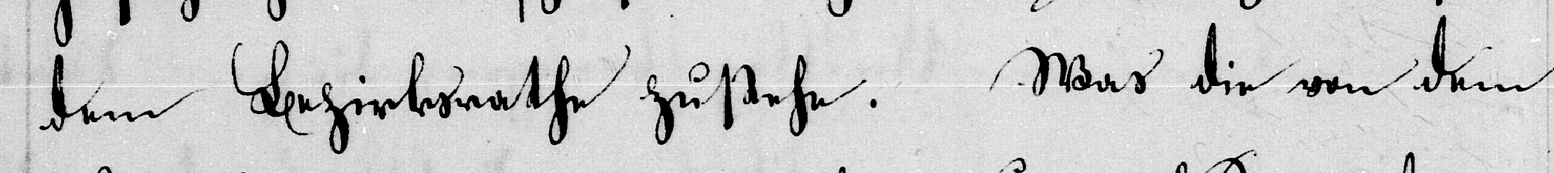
dem Bezirksrathe zustehe. Was die von dem
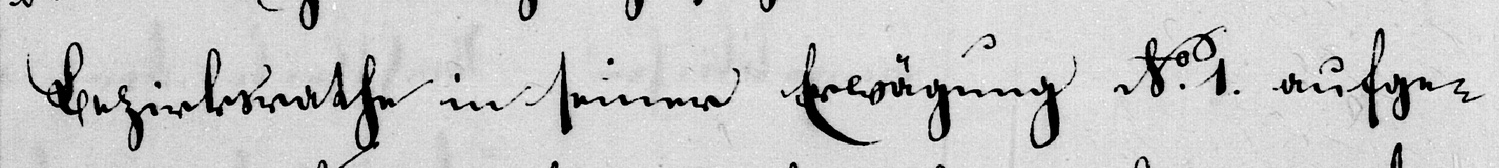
Bezirksrathe in seiner Erwägung N°.1. aufge¬
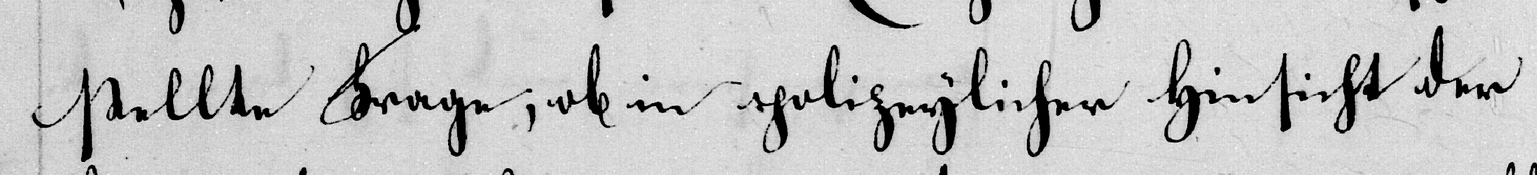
stellte Frage, ob in polizeylicher Hinsicht der
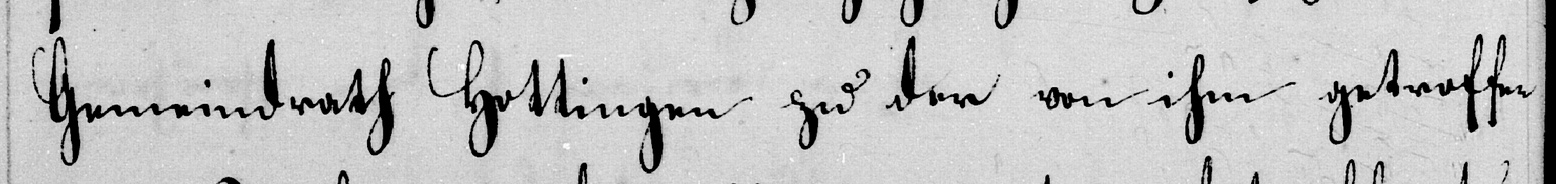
Gemeindrath Hottingen zu der von ihm getroffe¬
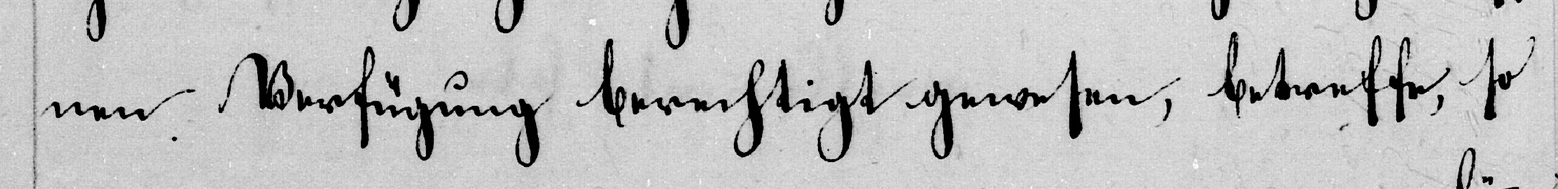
nen Verfügung berechtigt gewesen, betreffe, so
